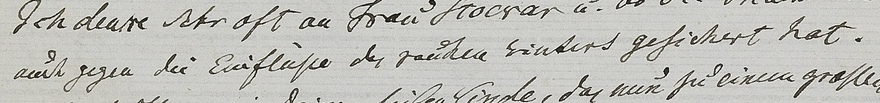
auch gegen die Einflüsse des rauhen Winters gesichert hat.
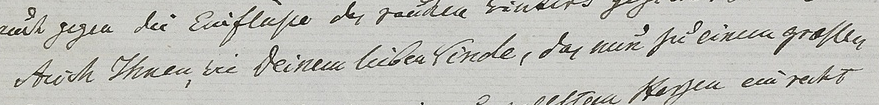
Auch Ihnen, wie Deinem lieben Kinde, das nun zu einem grossen
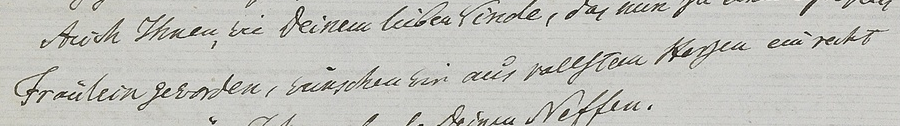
Fräulein geworden, wünschen wir aus vollstem Herzen ein recht
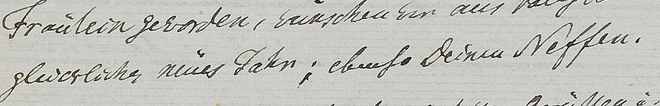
glückliches neues Jahr; ebenso Deinen Neffen.
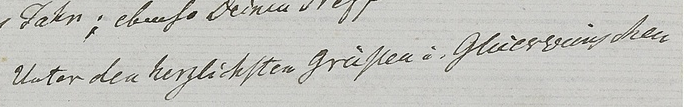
Unter den herzlichsten Grüssen u. Glückwünschen
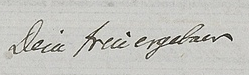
Dein treu ergebner
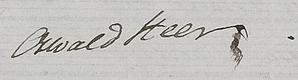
Oswald Heer.
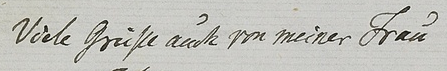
Viele Grüsse auch von meiner Frau
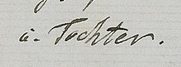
u. Tochter.
